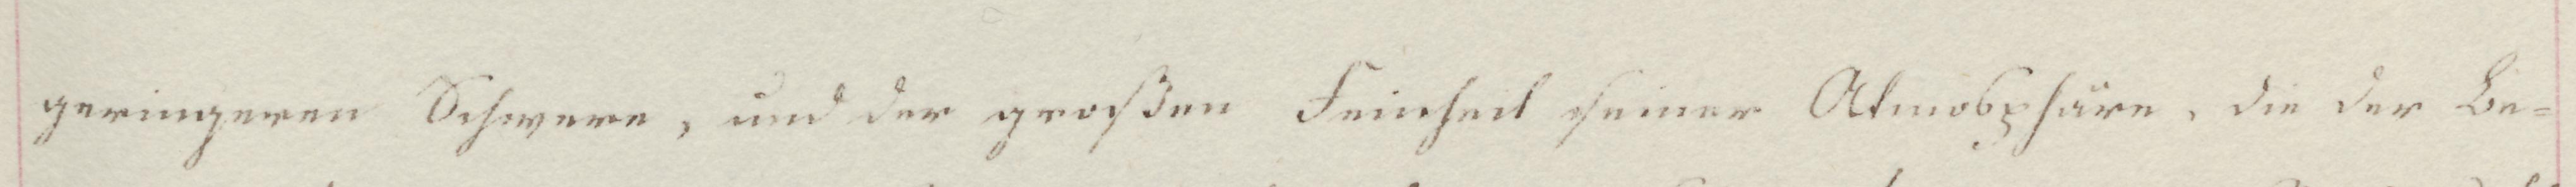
geringeren Schwere, und der großen Feinheit seiner Atmosphäre, die der Be-
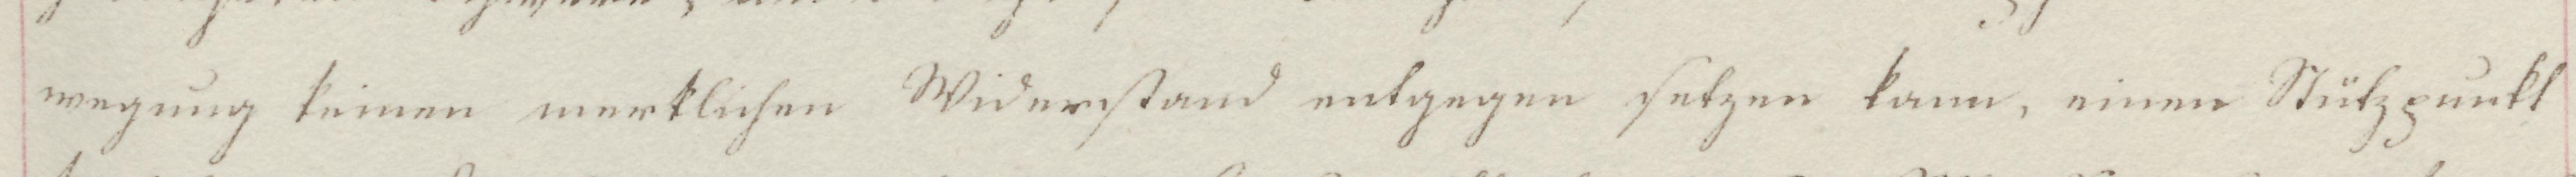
wegung keinen merklichen Widerstand entgegen setzen kann, einen Stützpunkt
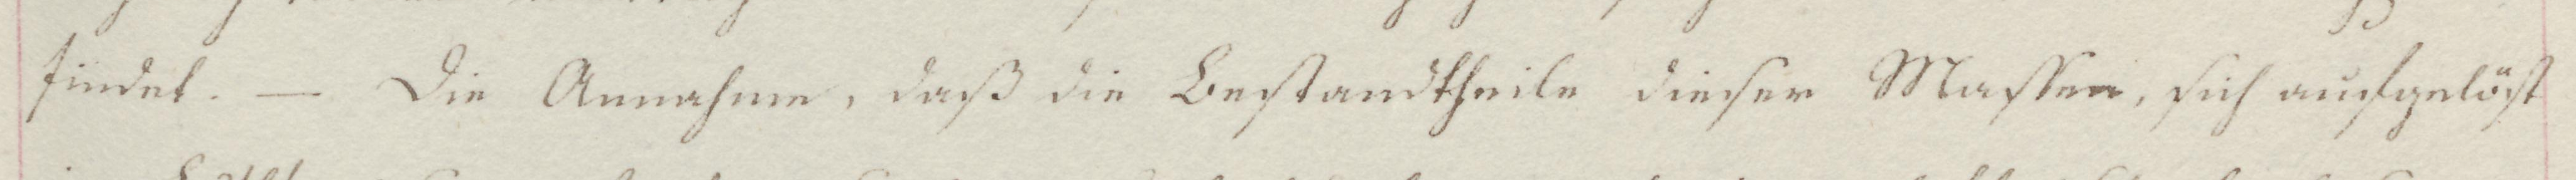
findet. – Die Annahme, daß die Bestandtheile dieser Massen, sich aufgelöst
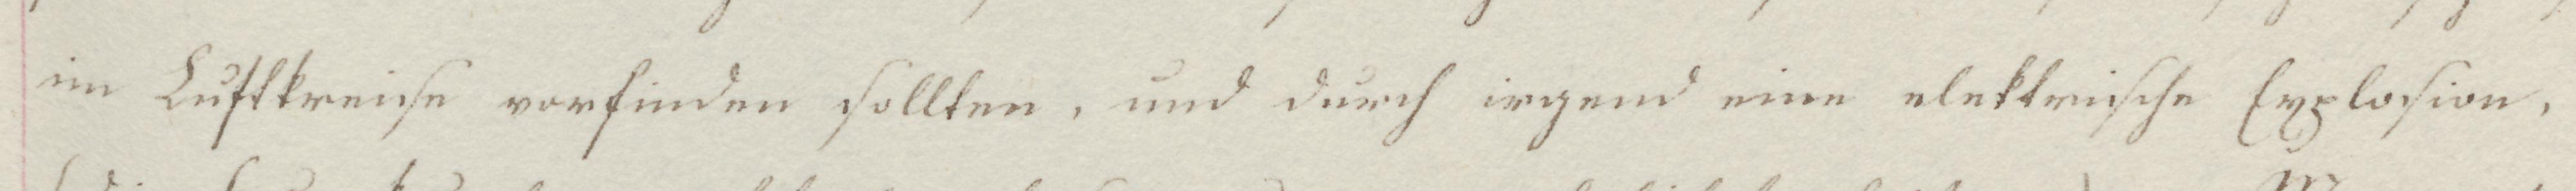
im Luftkreise vorfinden sollten, und durch irgend eine elektrische Explosion,
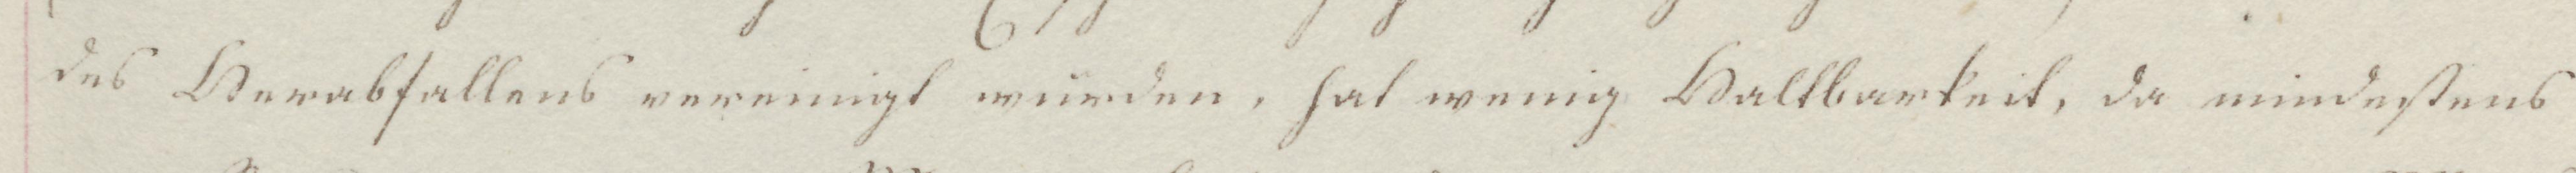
des Herabfallens vereinigt würden, hat wenig Haltbarkeit, da mindestens
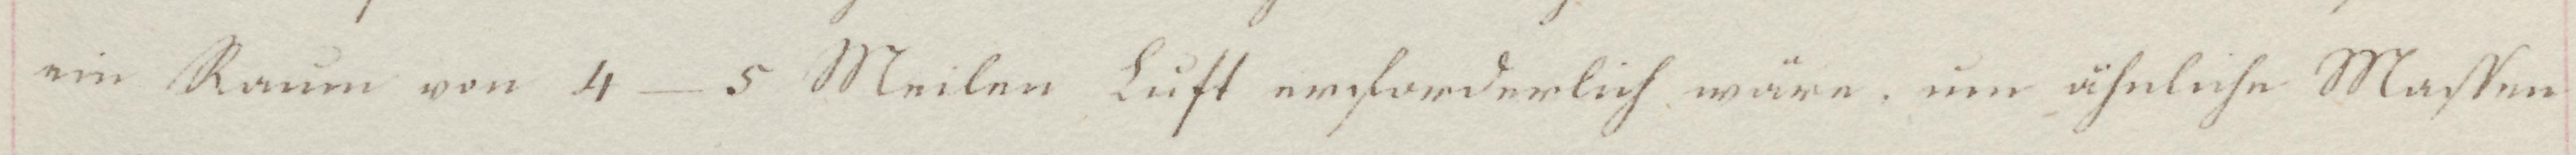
ein Raum von 4–5 Meilen Luft erforderlich wäre, um ähnliche Massen
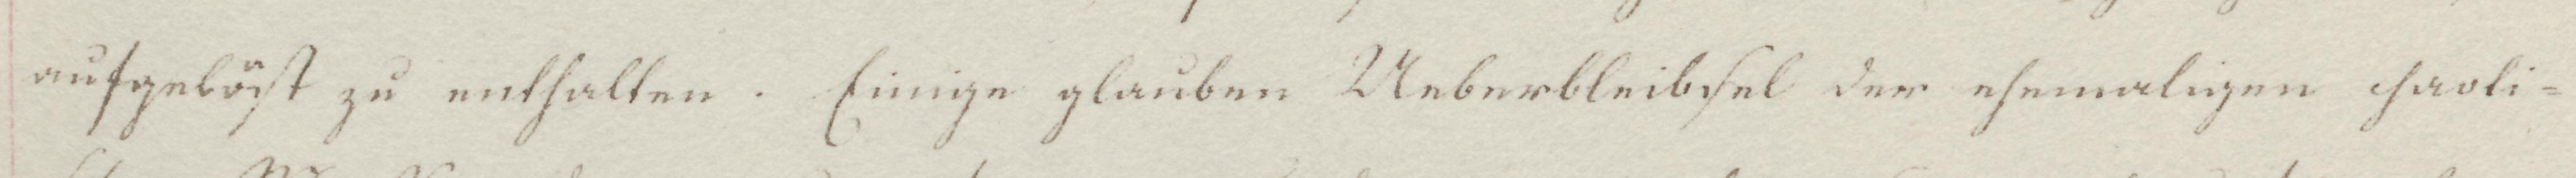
aufgelöst zu enthalten. Einige glauben Ueberbleibsel der ehemaligen chaoti-
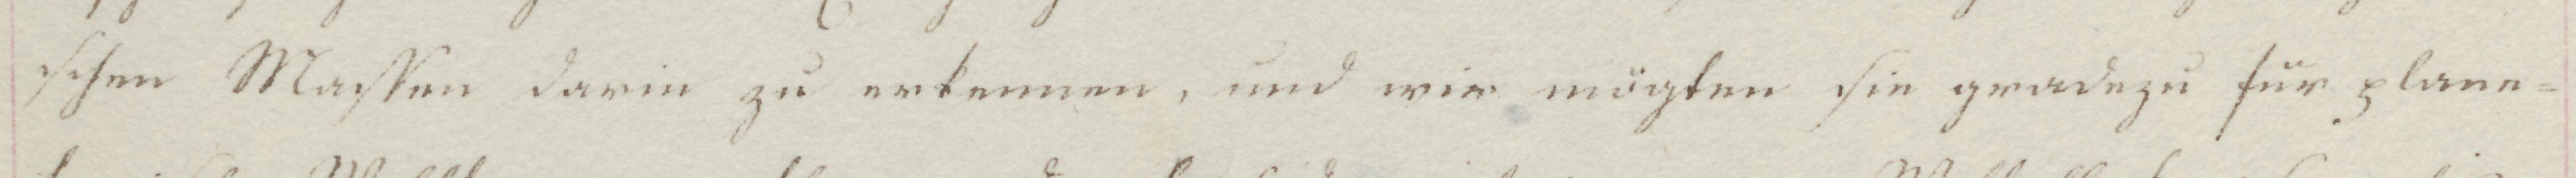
schen Massen darin zu erkennen, und wir mögten sie geradezu für plane-
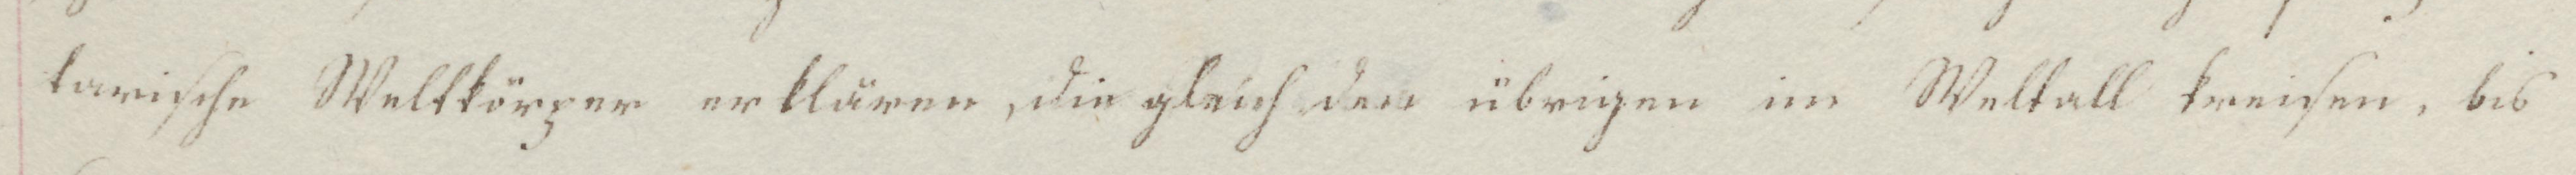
tarische Weltkörper erklären, die gleich den übrigen im Weltall kreisen, bis
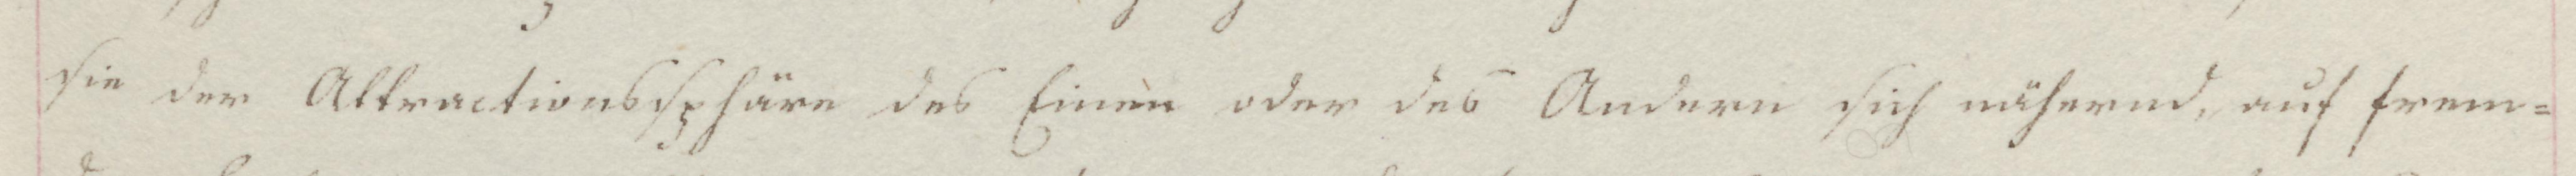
sie der Attractionssphäre des Einen oder Andern sich nähernd, auf frem-
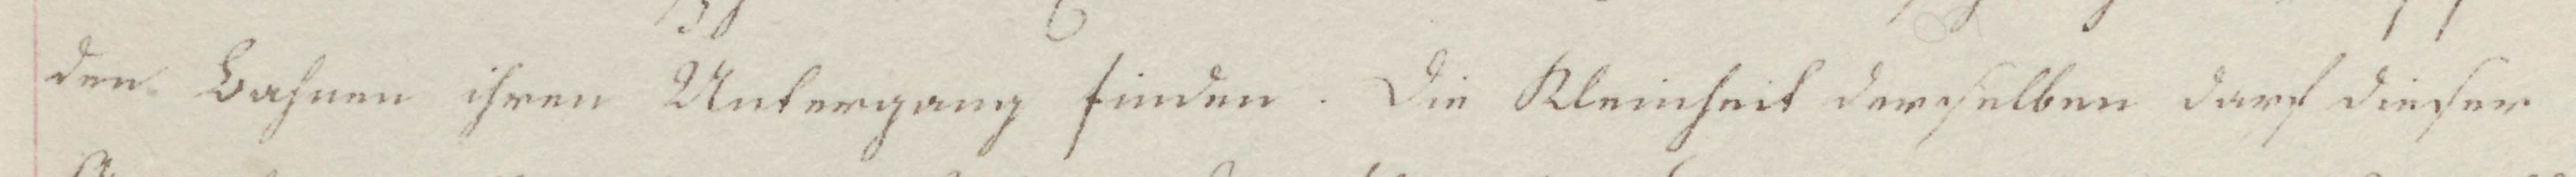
den Bahnen ihren Untergang finden. Die Kleinheit derselben darf dieser
